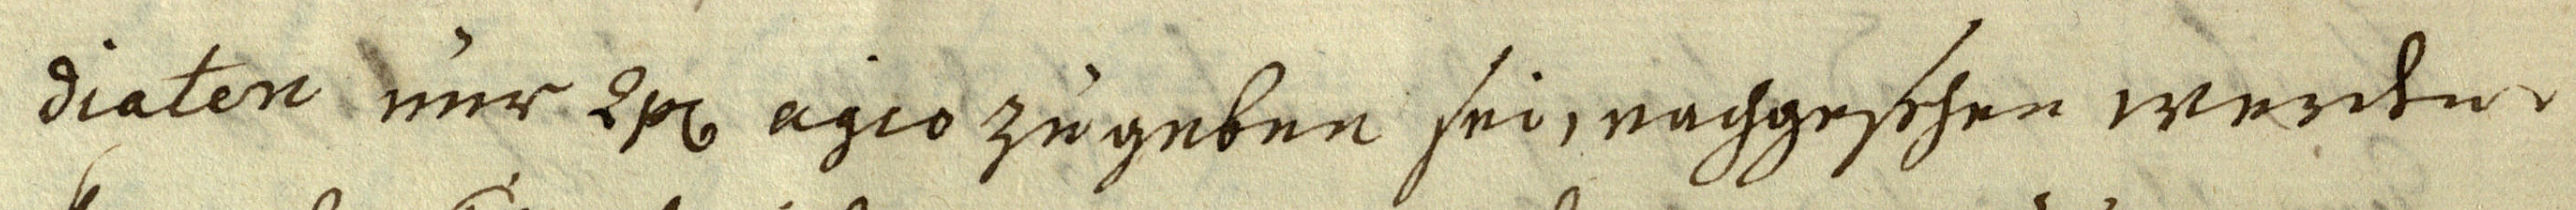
diatennur 2 p. agio zu geben sei, nachgesehen werden.
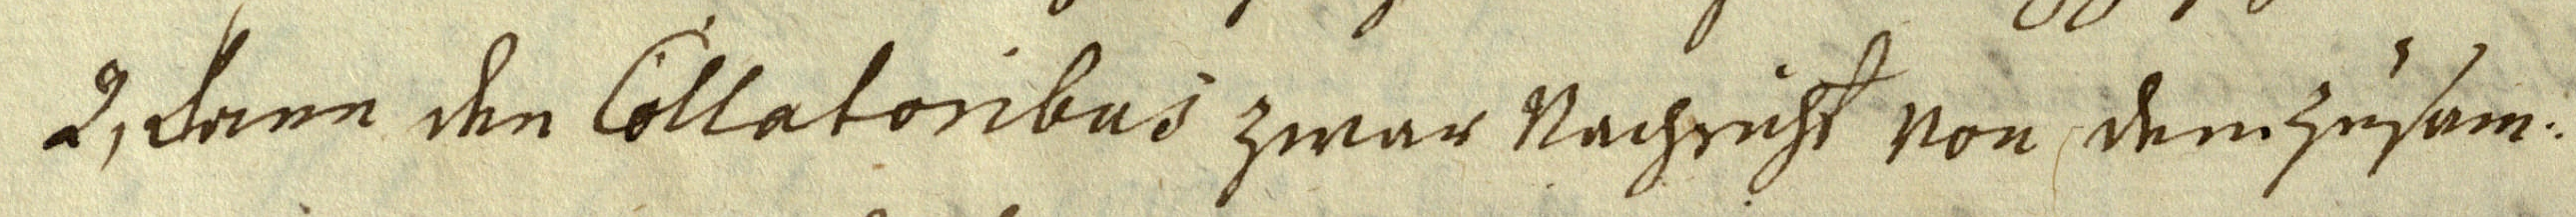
2, dann den Collatoribus zwar Nachricht von dem Zusam¬
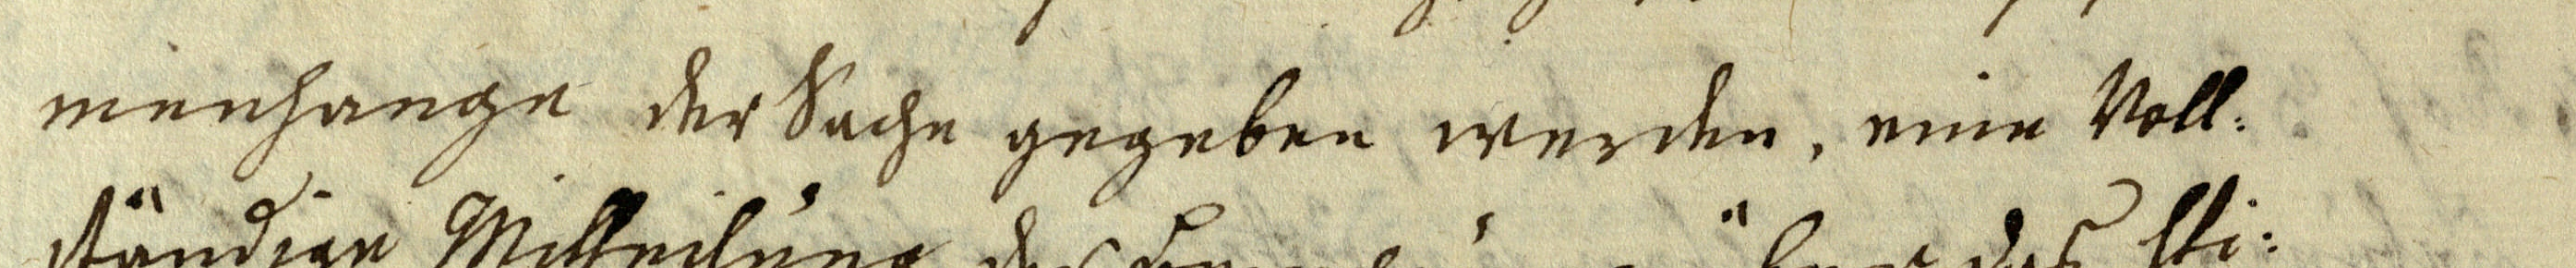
menhange der Sache gegeben werden, eine voll¬
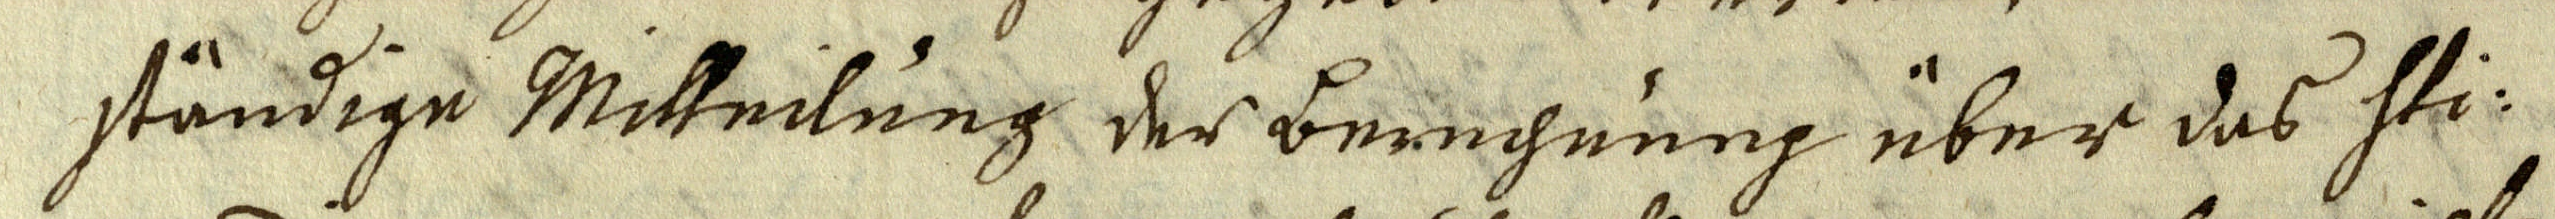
ständige Mitteilung der Berechnung über das sti¬
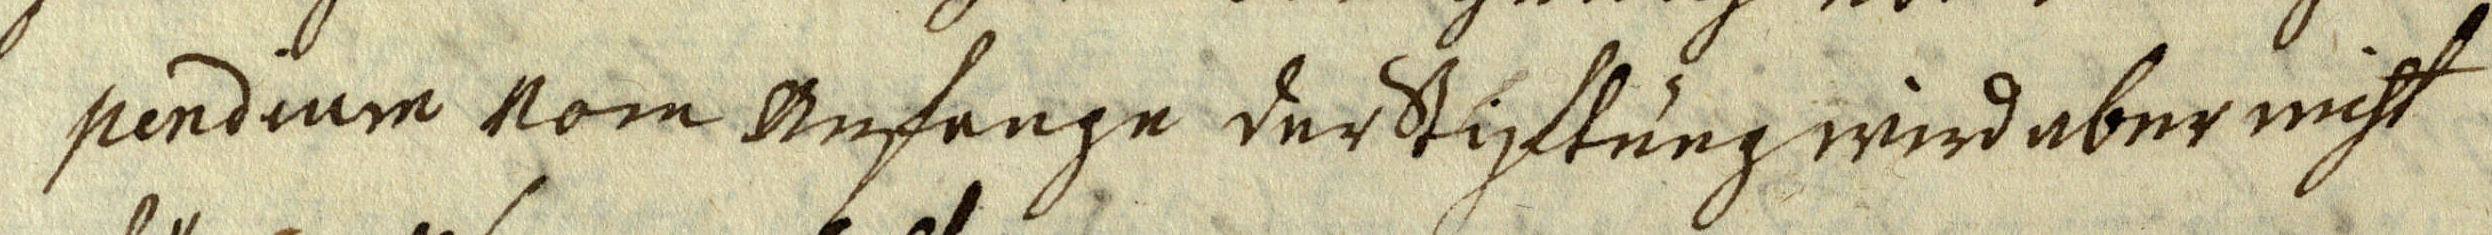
pendium vom Anfange der Stiftung wird aber nicht
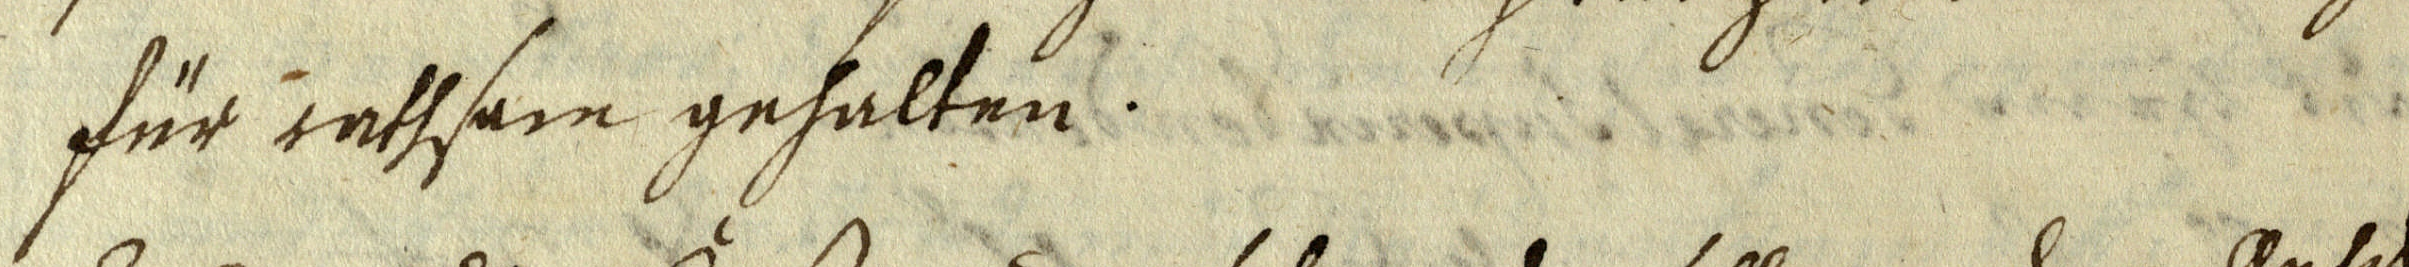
für rathsam gehalten.
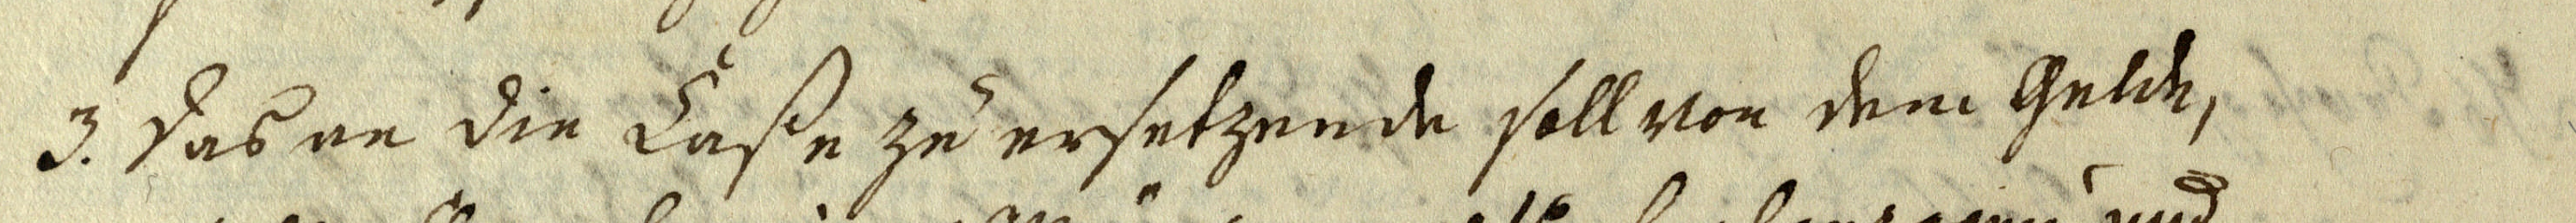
3. das an die Caße zu ersetzende soll von dem Gelde,
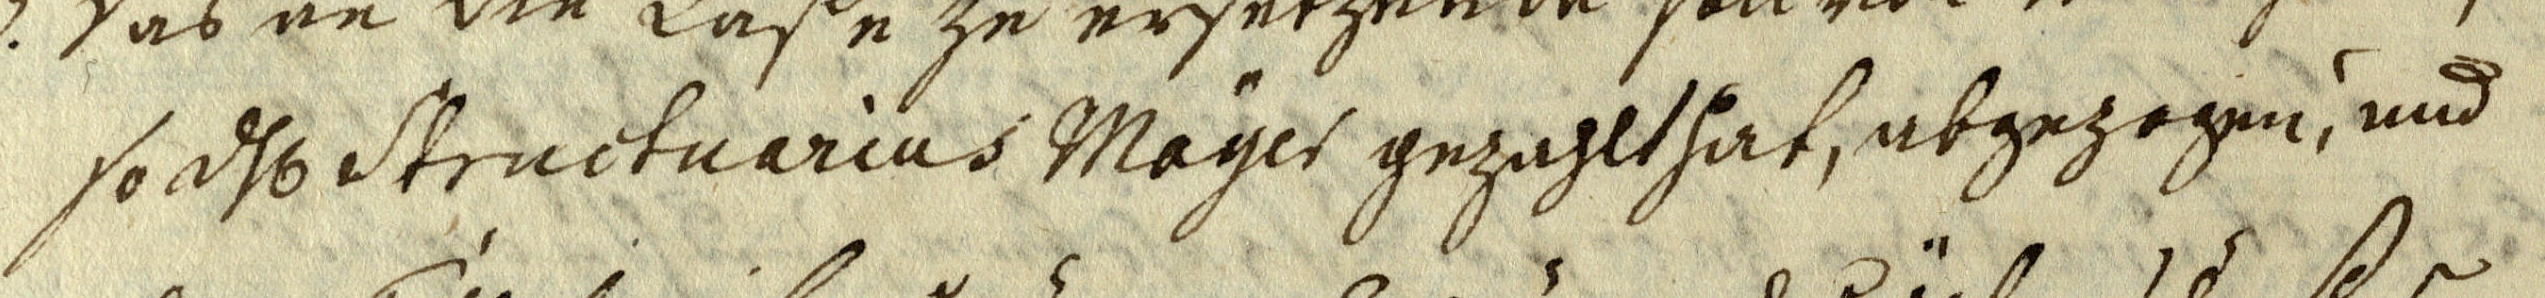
so dh Structuarius Maÿer gezahlt hat, abgezogen, und
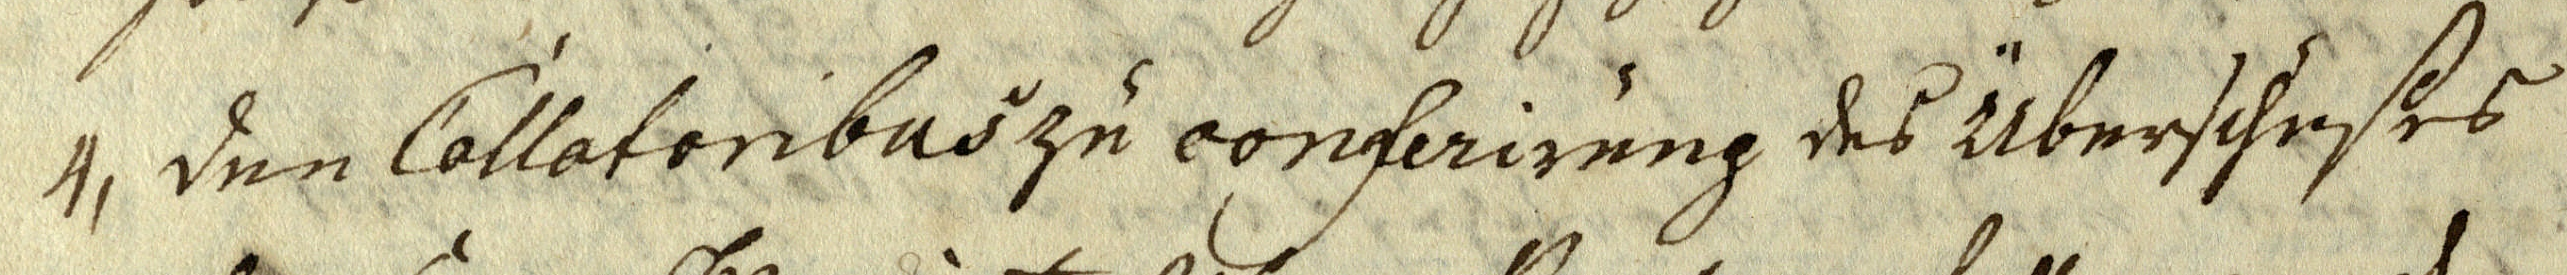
4, den Collatoribus zu conferirung des Überschußes
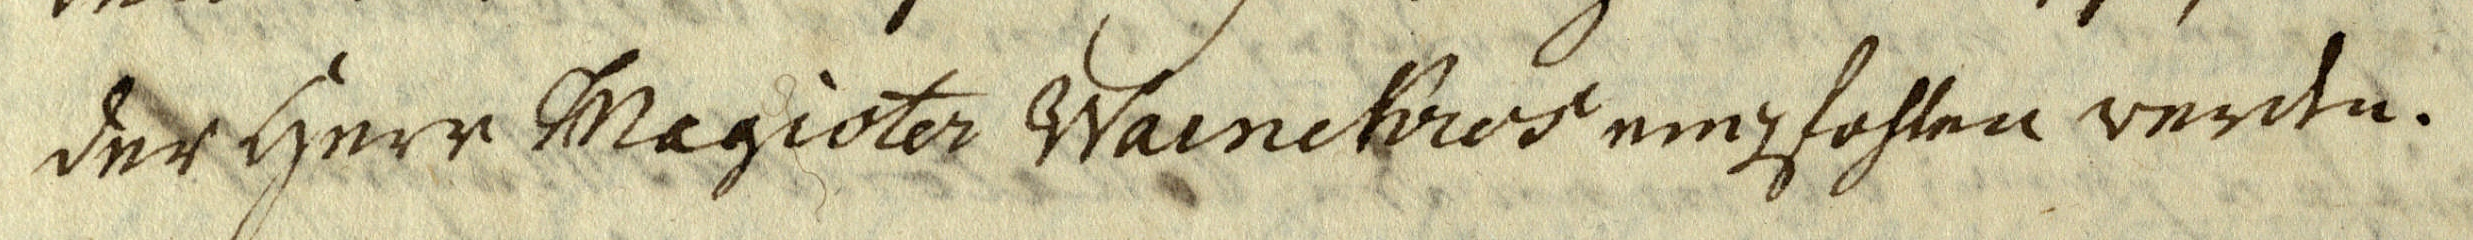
der Herr Magister Warnekros empfohlen werden..
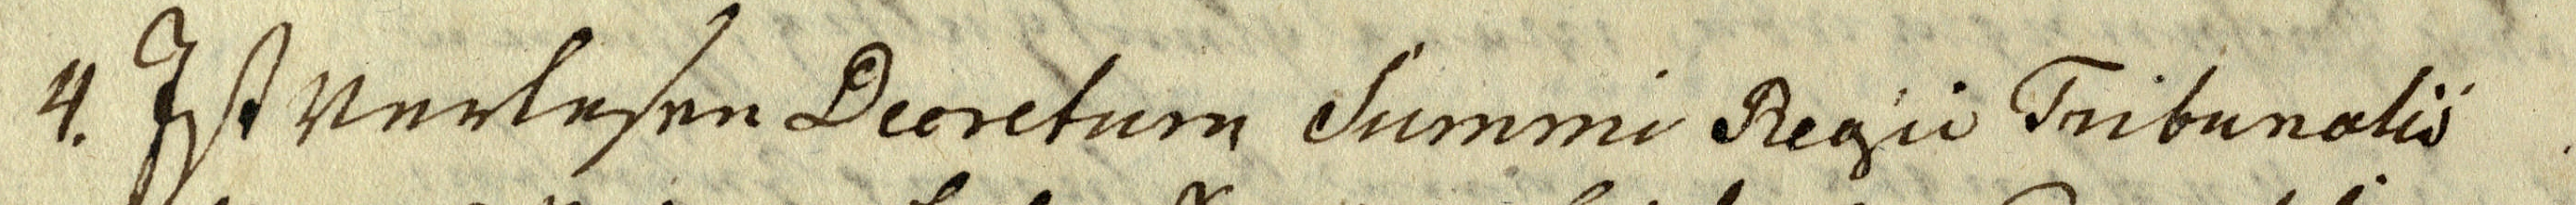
4. Ist verlesen Decretum Summi Regii Tribunalis
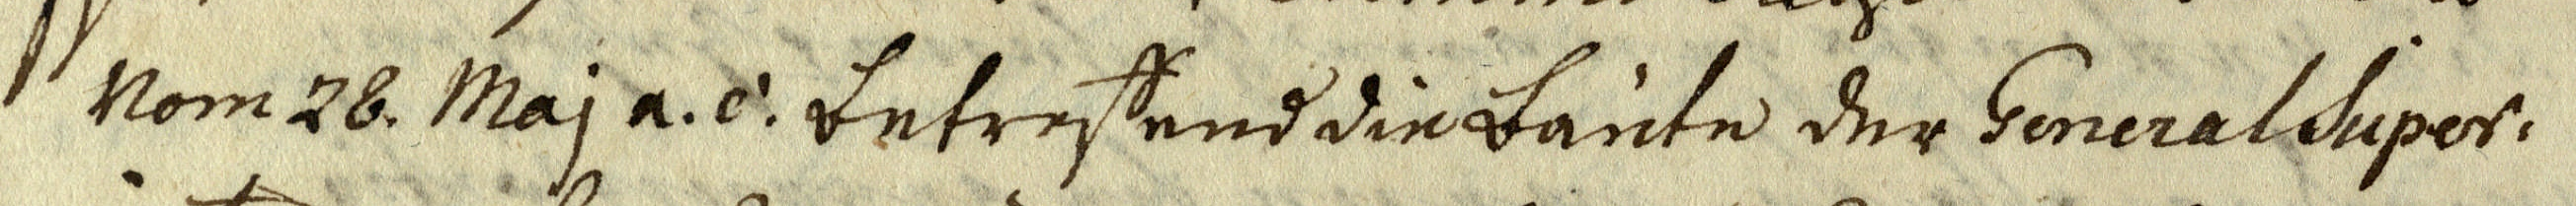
vom 28. Maj a. c. betreffend die Baute der GeneralSuper¬
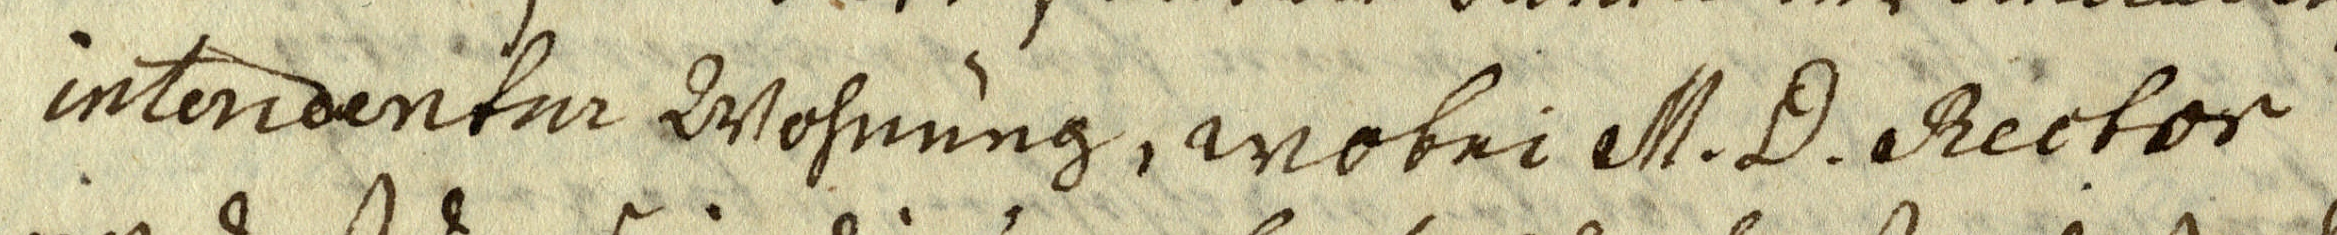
intendentur Wohnung, wobei M. D. rector
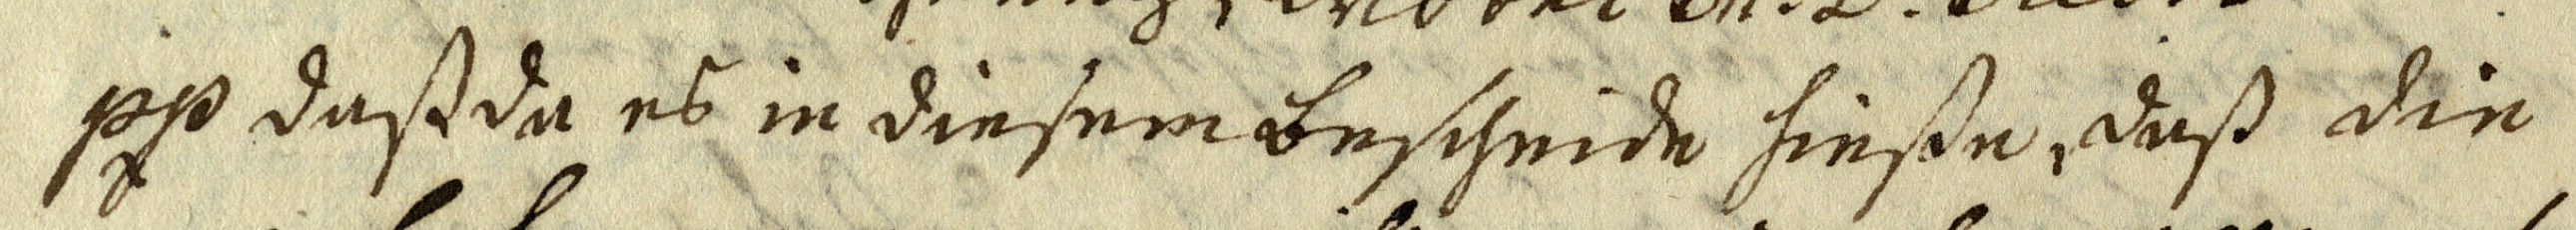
pp daß da es in diesem Bescheide hieße, daß die
